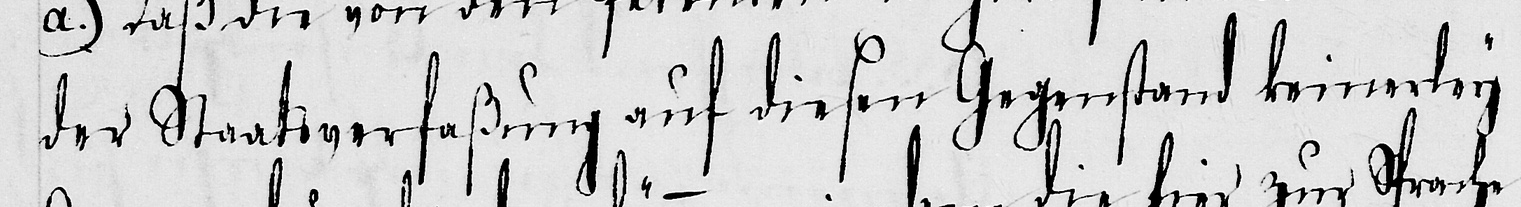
der Staatsverfaßung auf diesen Gegenstand keinerley
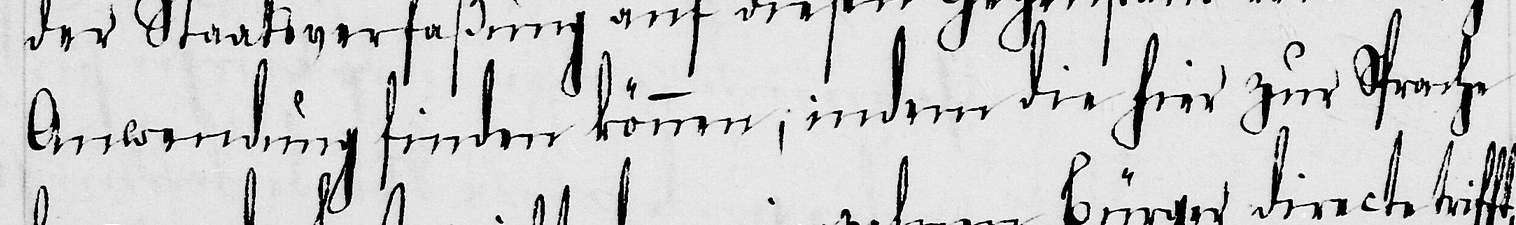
Anwendung finden können, indem die hier zur Sprache
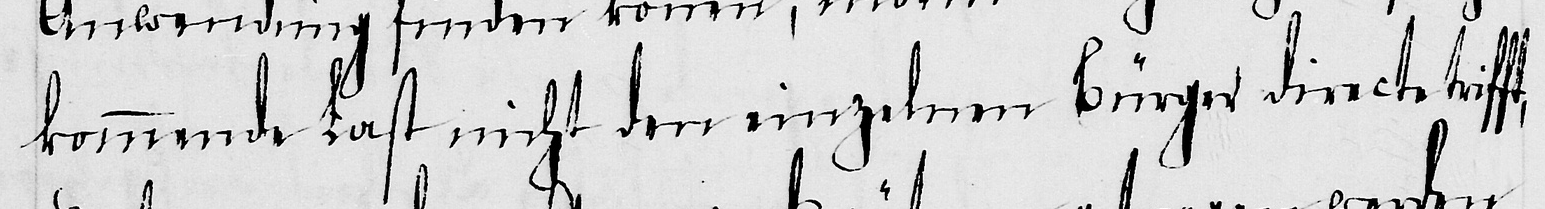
kommende Last nicht den einzelnen Bürger directe trif¬
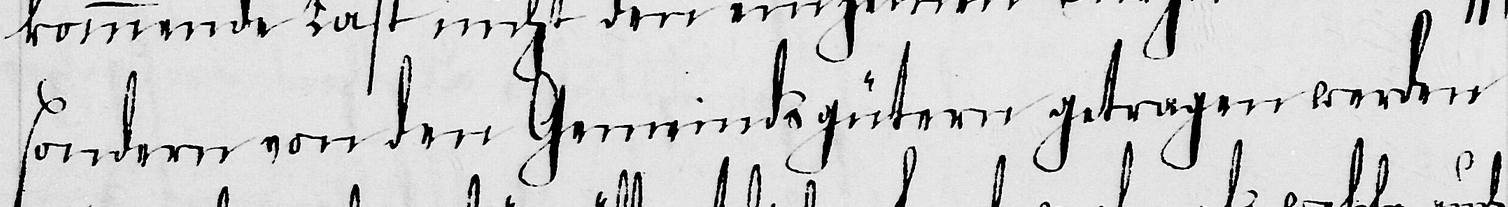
sondern von den Gemeindsgütern getragen werden
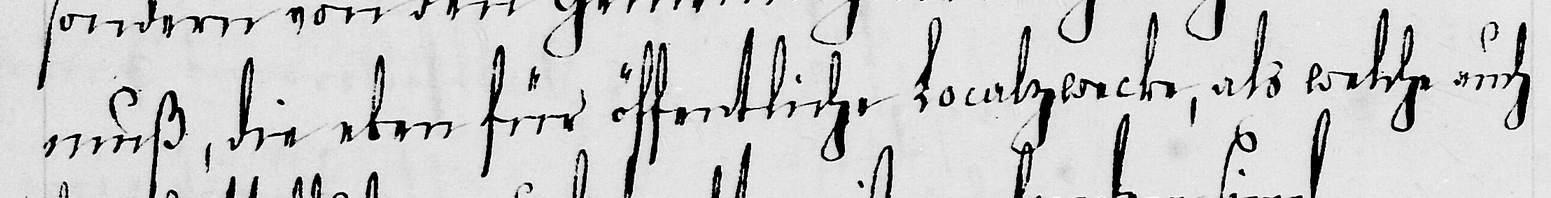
muß, die eben für öffentliche Localzwecke, als welche auch
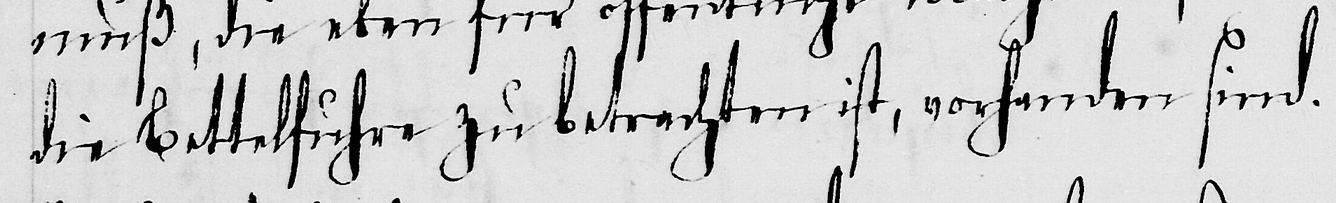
die Bettelfuhre zu betrachten ist, vorhanden sind.
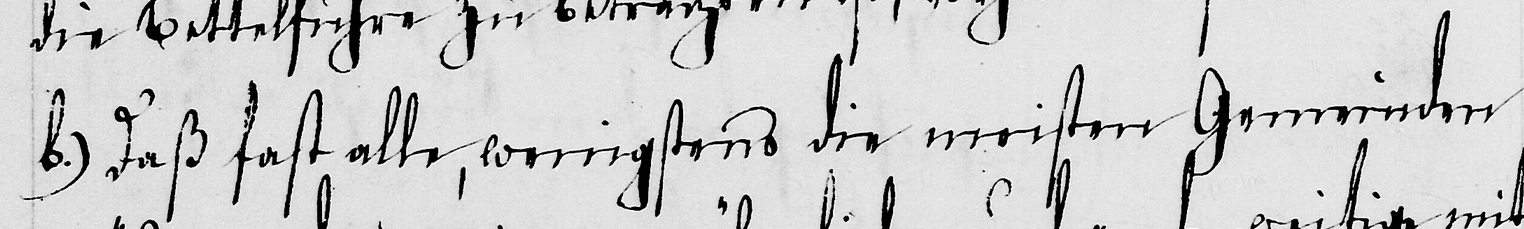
b.) Daß fast alle, wenigsten die meisten Gemeinden
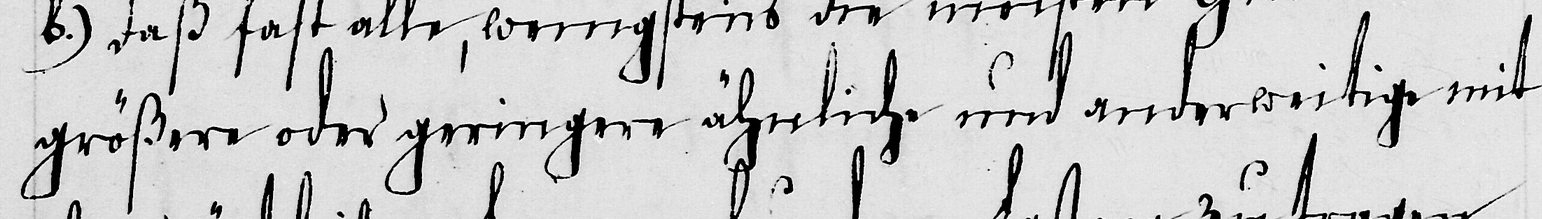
größere oder geringere ähnliche und anderweitige mit
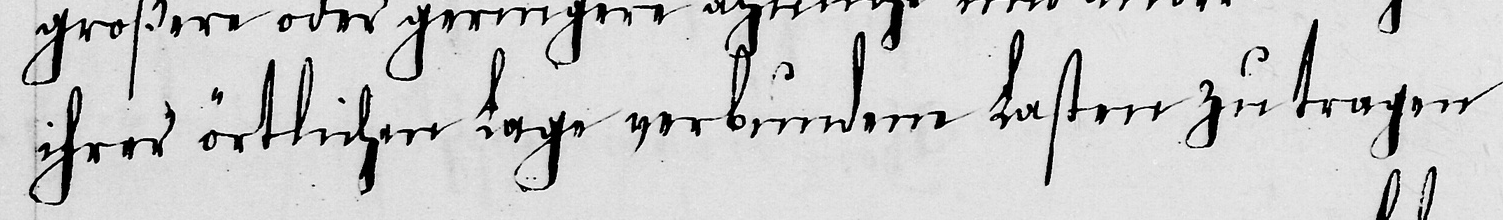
ihrer örtlichen Lage verbundene Lasten zu tragen
